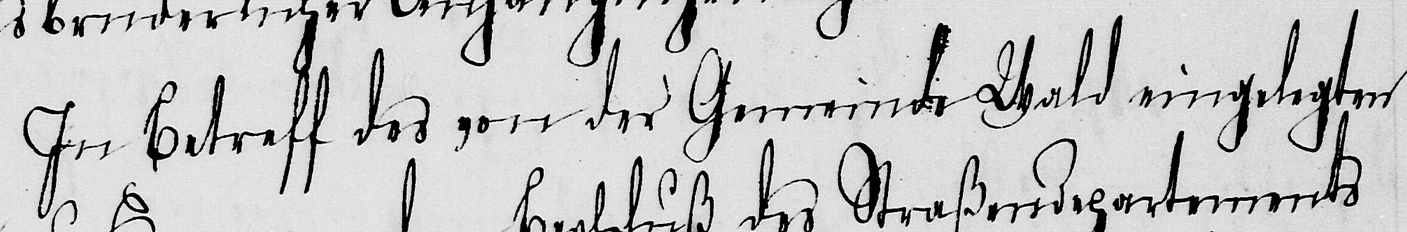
In Betreff des von der Gemeinde Wald eingelegten
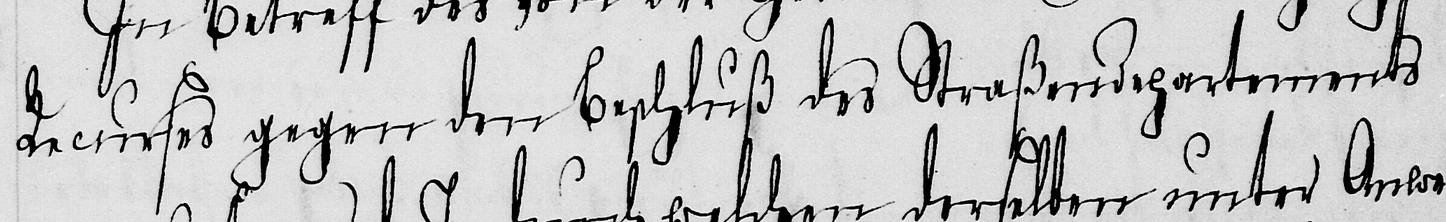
Recurses gegen den Beschluß des Straßendepartements
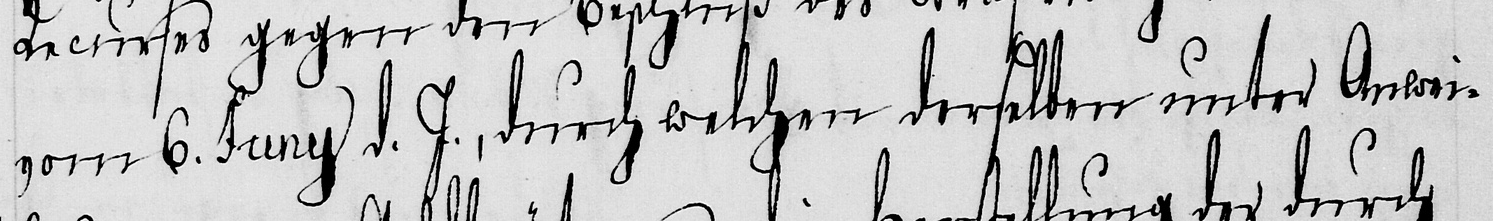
vom 6. Juny d. J., durch welchen derselben unter Anwei¬
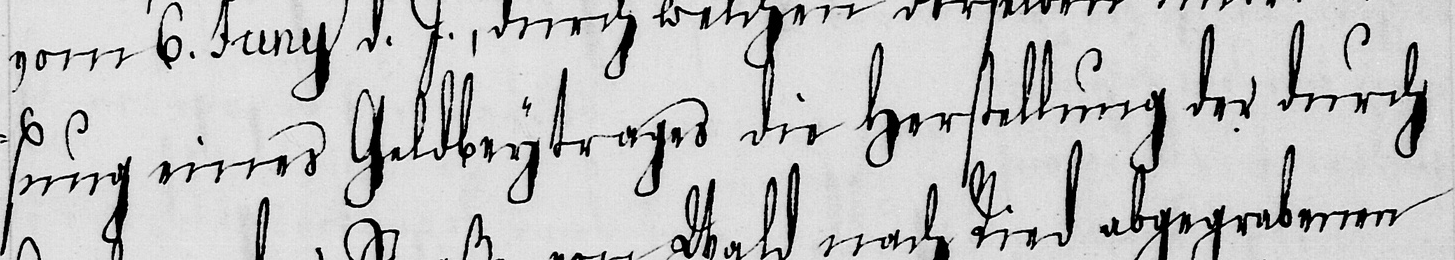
sung eines Geldbeytrages die Herstellung der durch
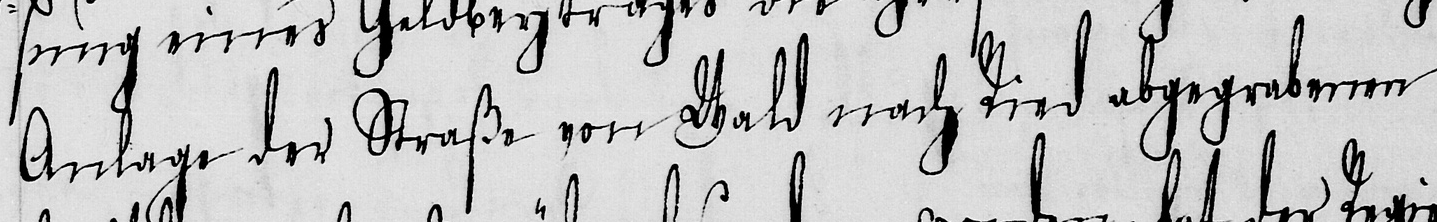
Anlage der Straße von Wald nach Ried abgegrabenen
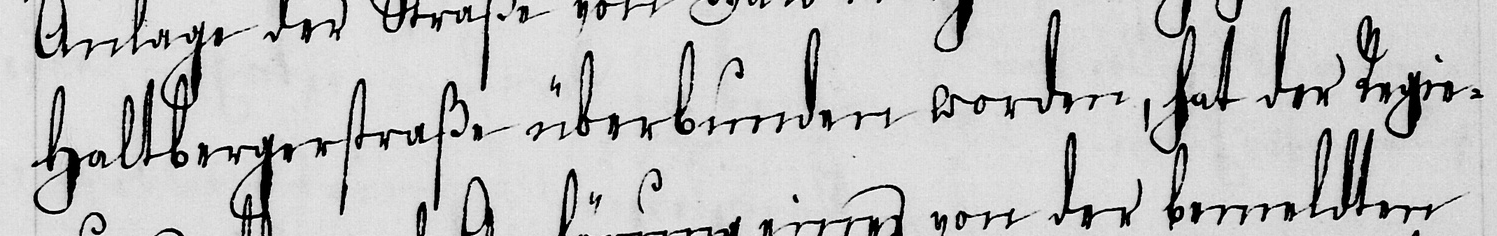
Haltbergerstraße überbunden worden, hat der Regie¬
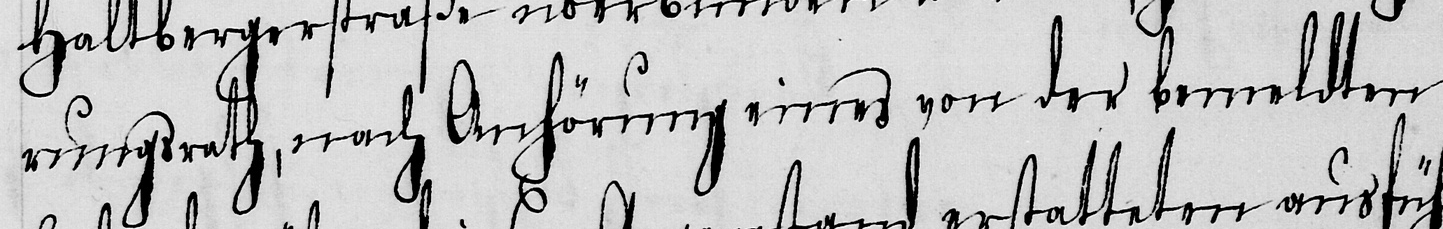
rungsrath, nach Anhörung eines von der bemeldten
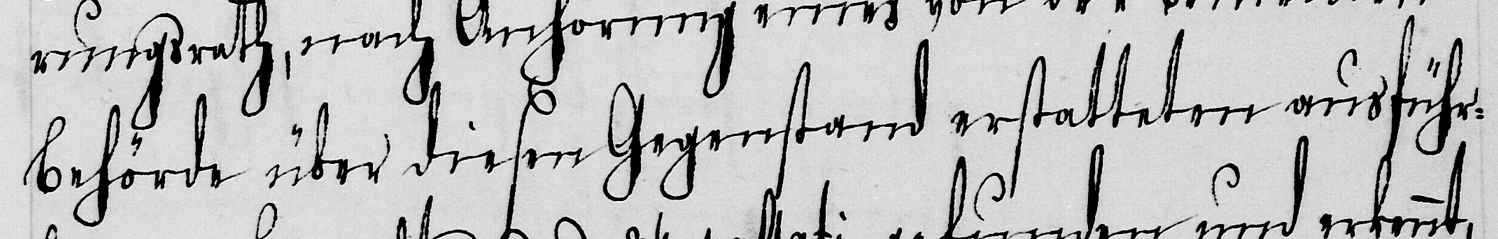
Behörde über diesen Gegenstand erstattetten ausführ¬
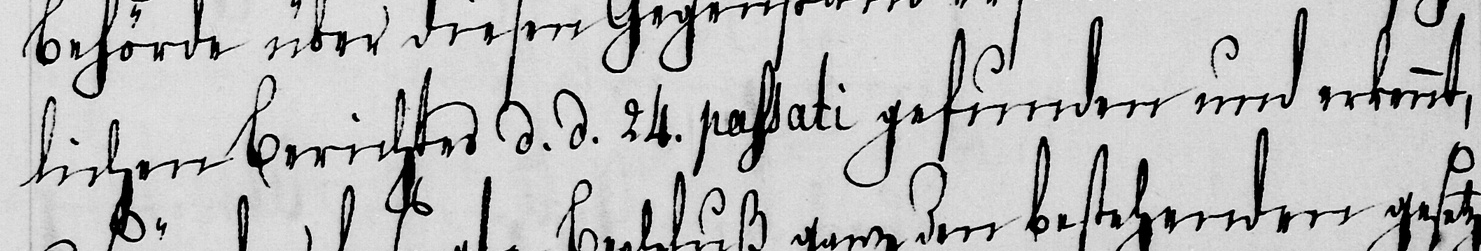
lichen Berichtes d. d. 24. passati gefunden und erkann¬
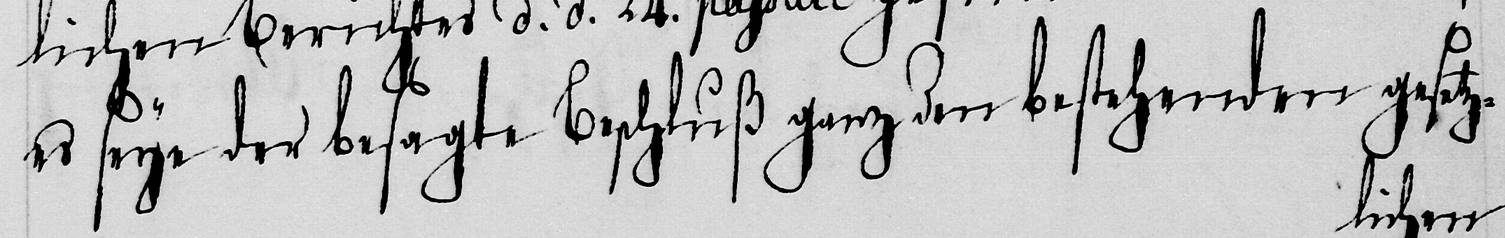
es seye der besagte Beschluß ganz den bestehenden gesetz-
